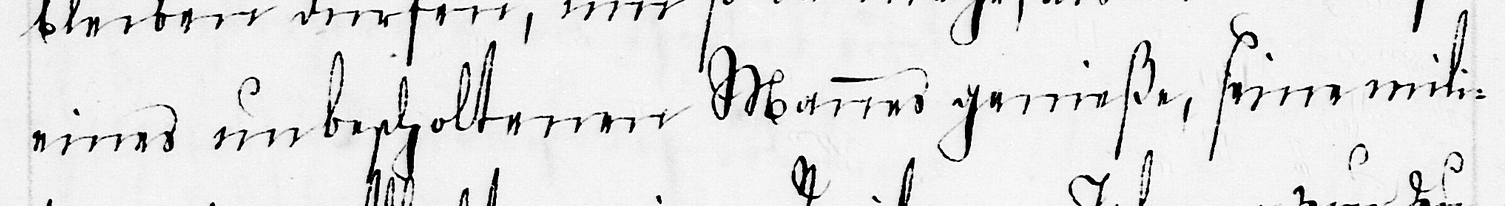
eines unbescholtenen Mannes genieße, seine mili¬
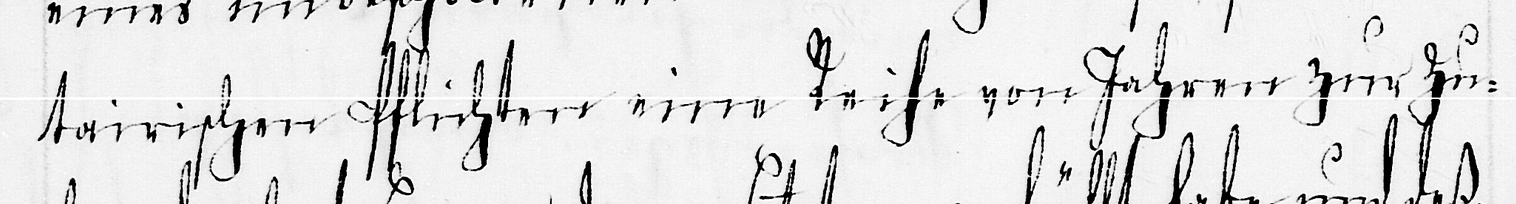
tairischen Pflichten eine Reihe von Jahren zur Zu¬
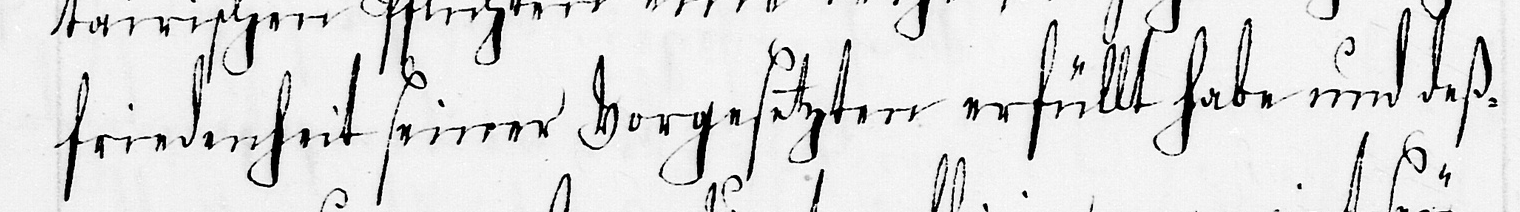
friedenheit seiner Vorgesetzten erfüllt habe und deß¬
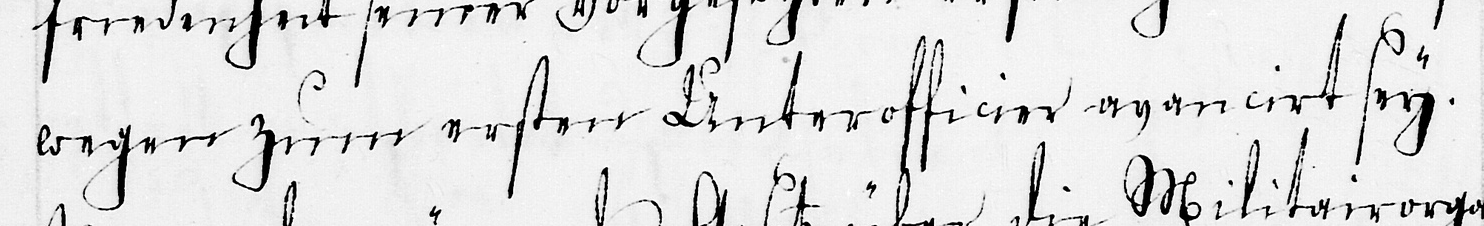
wegen zum ersten Unterofficier avancirt sey.
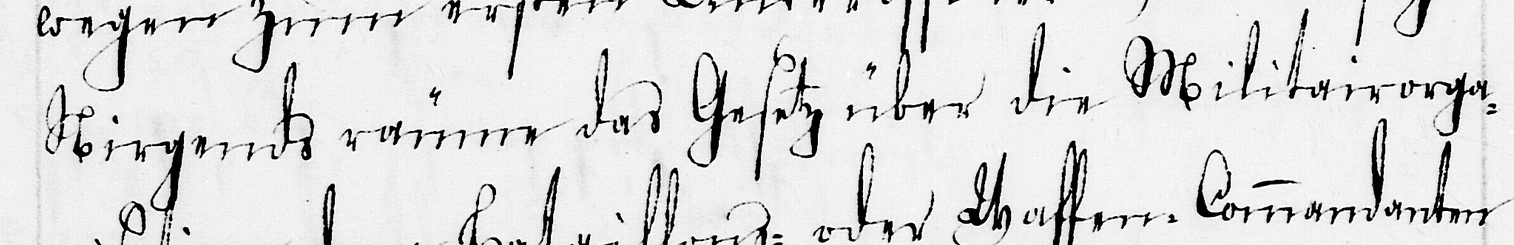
Nirgends räume das Gesetz über die Militairorga¬
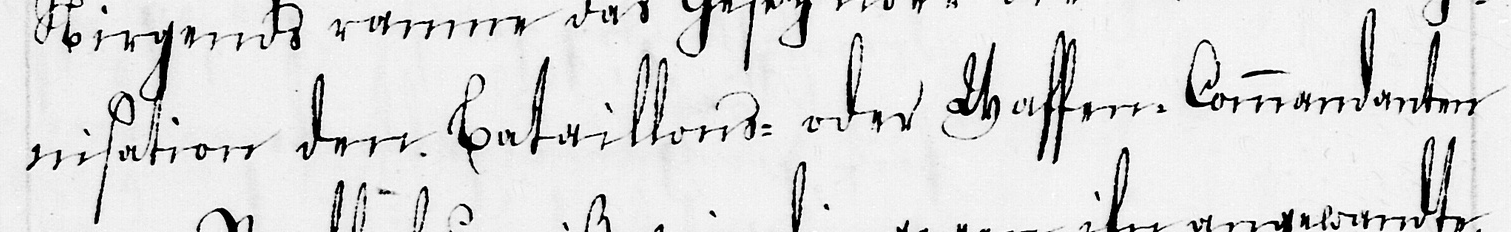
nisation den Bataillons- oder Waffen-Commandanten
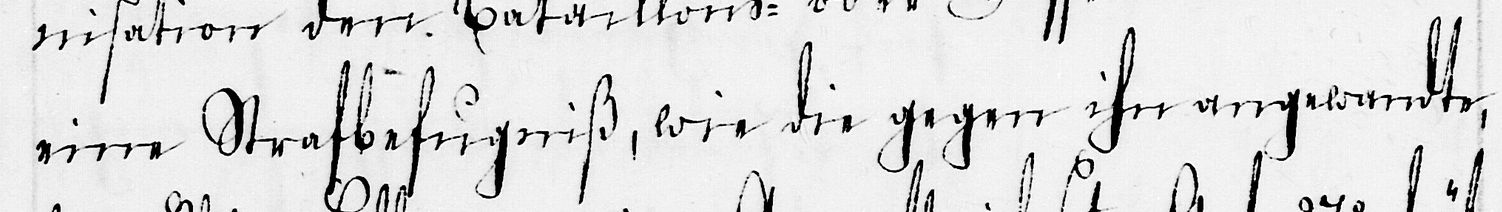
eine Strafbefugniß, wie die gegen ihn angewandte,
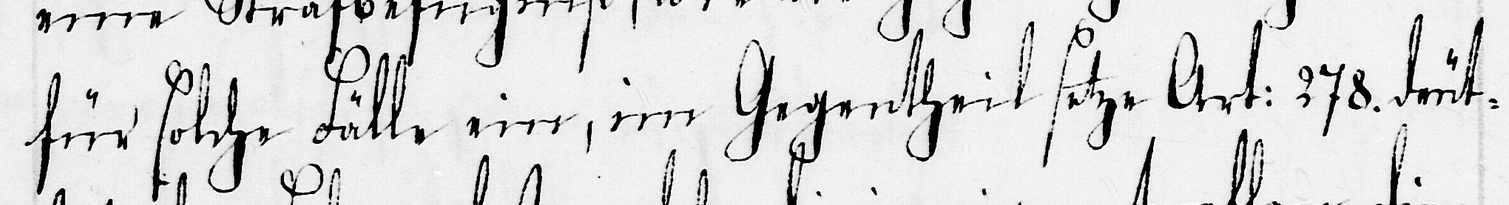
für solche Fälle ein, im Gegentheil setze Art: 278. deu¬
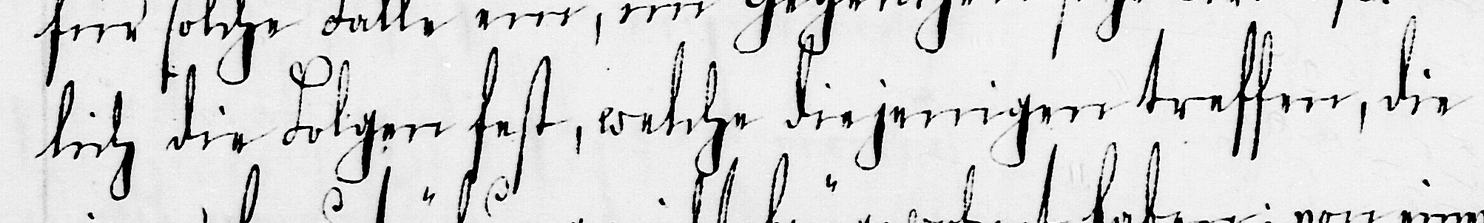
tlich die Folgen fest, welche diejenigen treffen, die
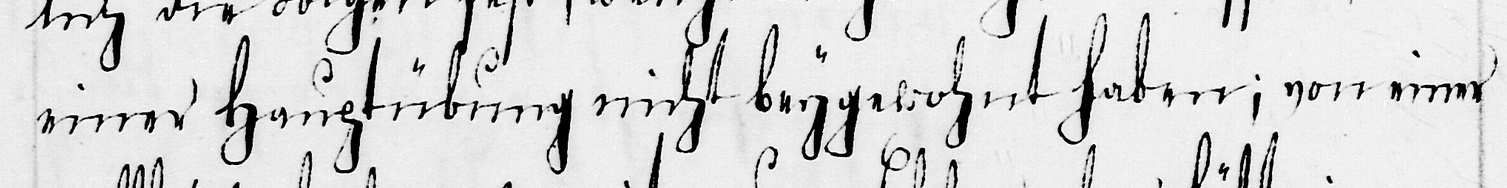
einer Hauptübung nicht beygewohnt haben; von einer
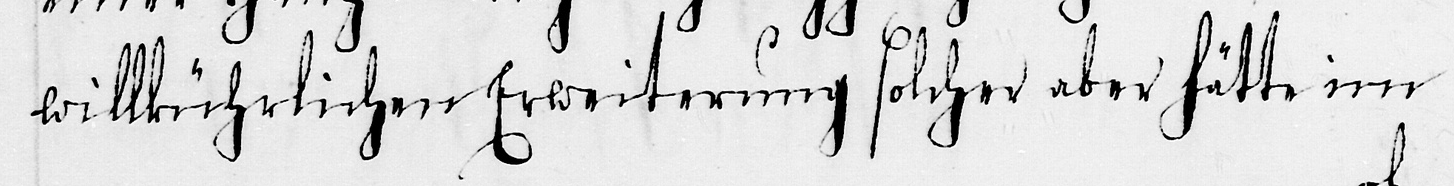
willkührlichen Erweiterung solcher aber hätte im
